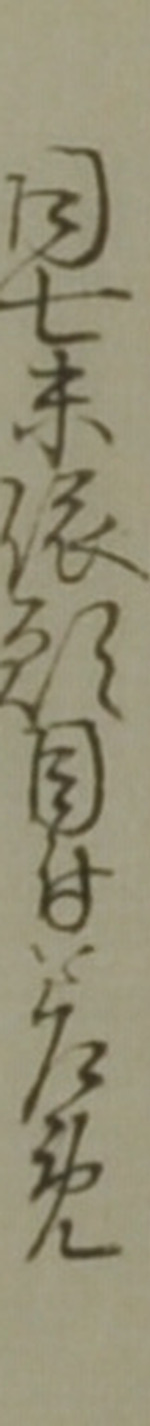同七未依願目付差免
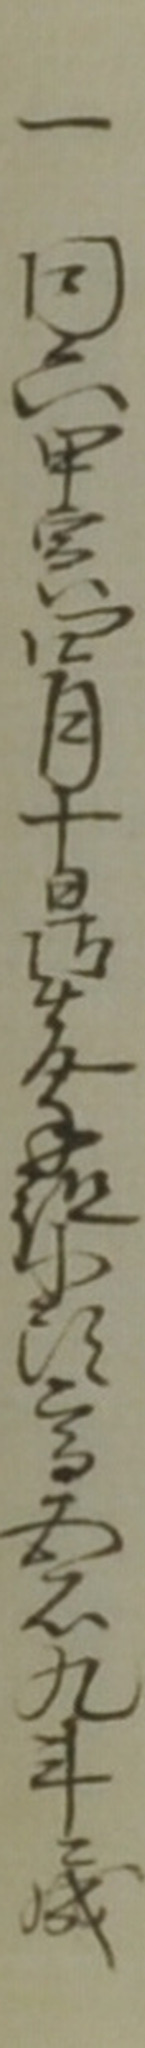一同六甲寅四月十日御先手組小頭高五石九斗ニ成
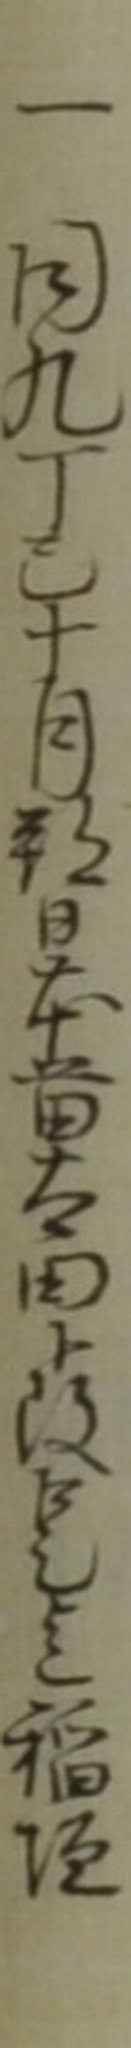一同九丁巳十月朔日本苗太田ト改是迄稲垣
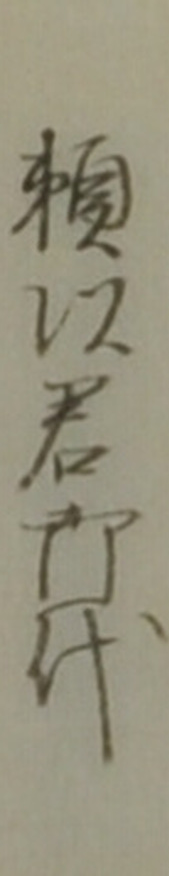頼以君御代
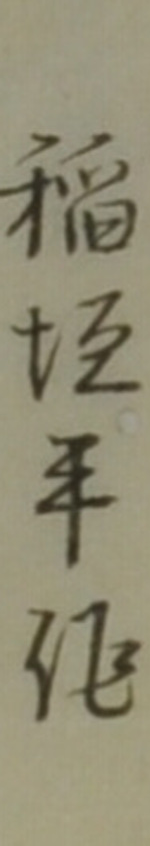稲垣平作
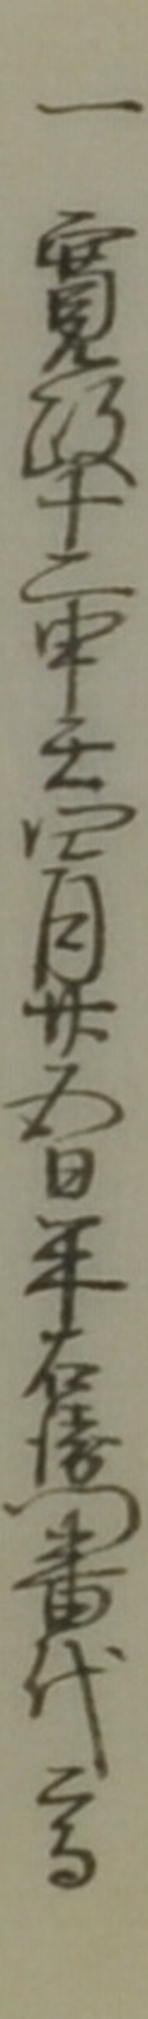一寛政十二申閏四月廿五日平右衛門番代高
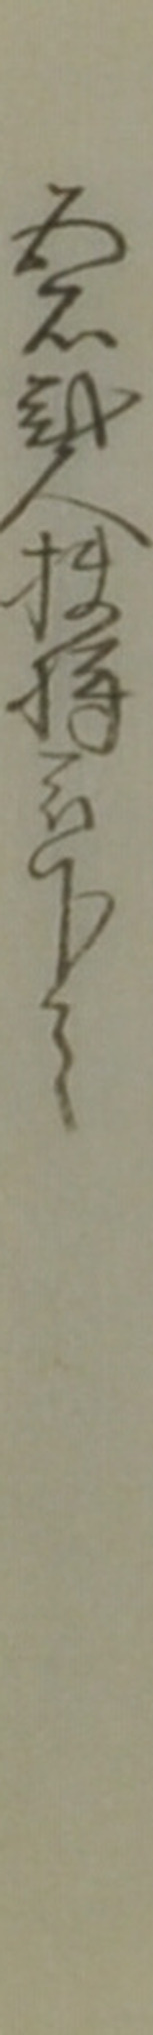五石弐人扶持被下之
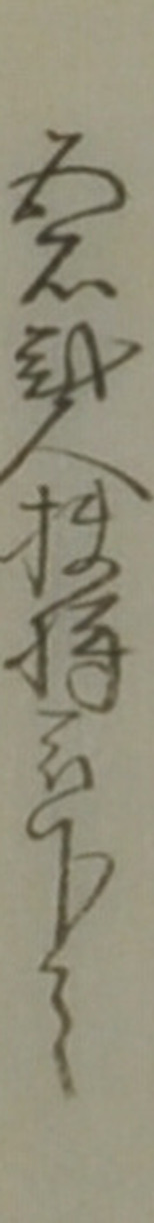五石弐人扶持被下之
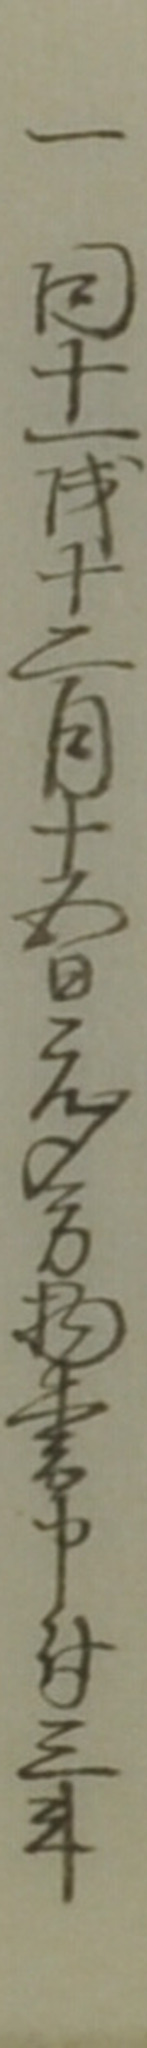一同十一戌十二月十五日元〆方物書申付三斗
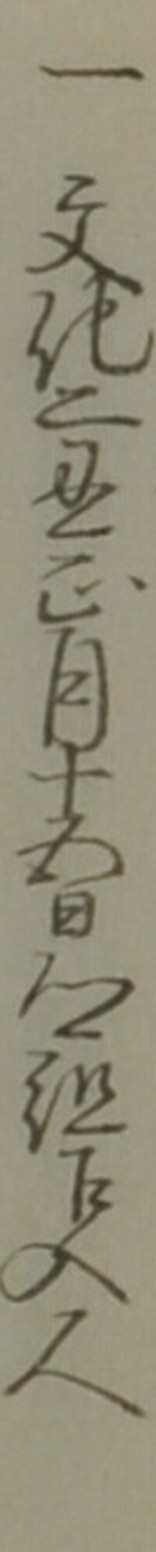一文化二丑正月十五日郷組江入人
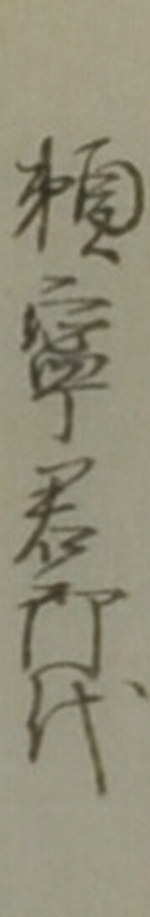頼寧君御代
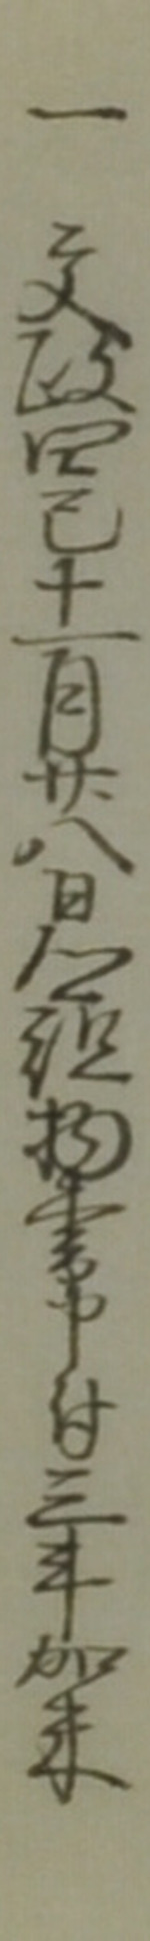一文政四巳十一月廿八日郷組物書申付三斗加米
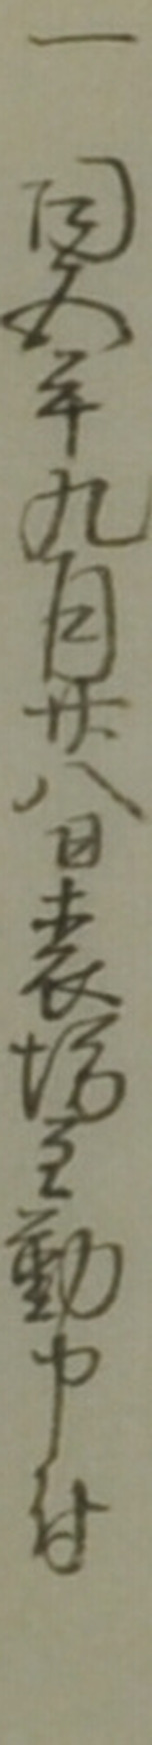一同五午九月廿八日表坊主勤申付
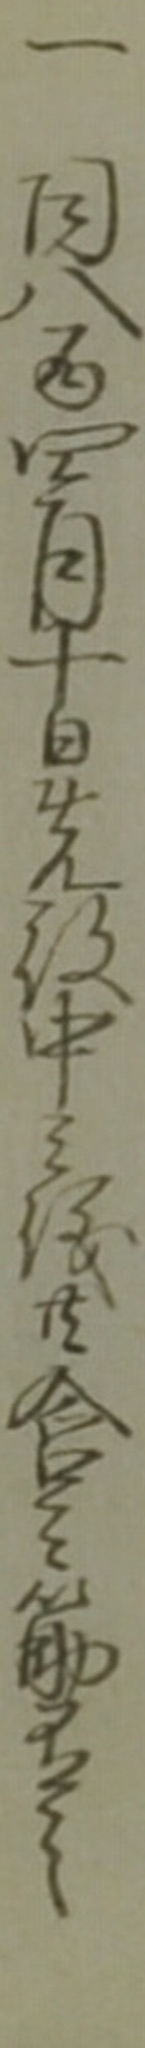一同八酉四月十日先役中之儀共含之筋有之
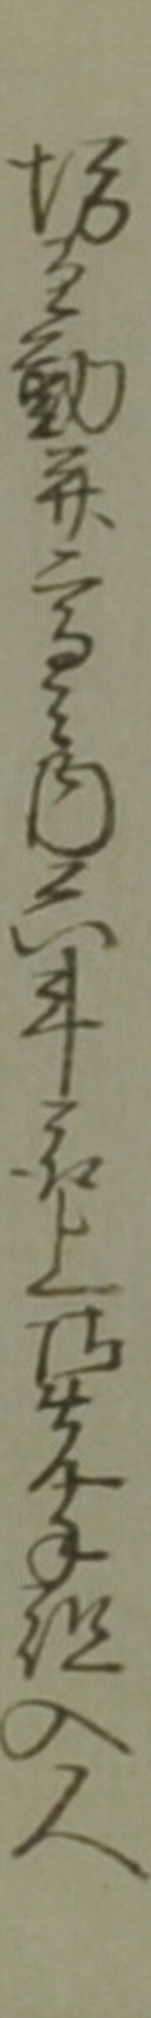坊主勤并高之内六斗取上御先手組入人
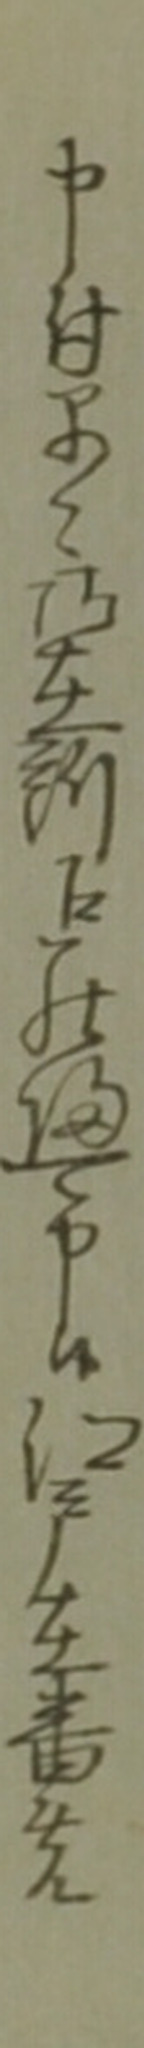申付早々御在所江罷帰可申候江戸在番先
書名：無足諸士勤仕録（八）
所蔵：伊那市立高遠町図書館・合同会社AMANE
